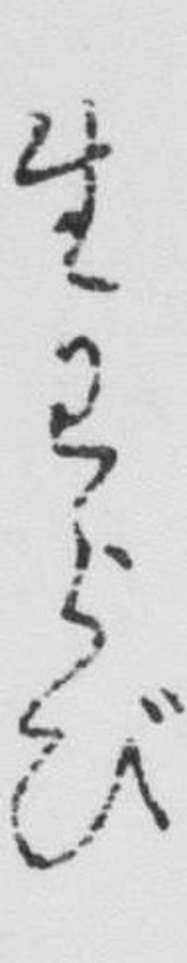生わらび
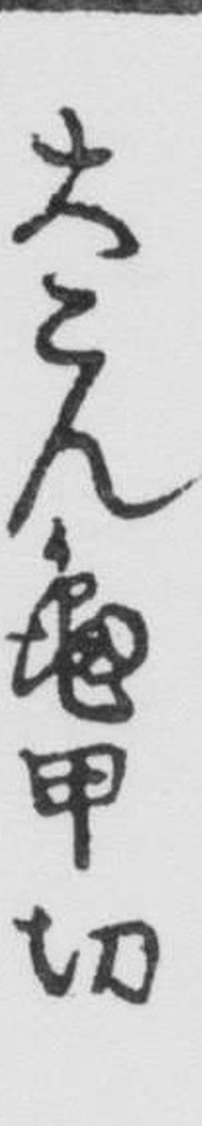大こん亀甲切
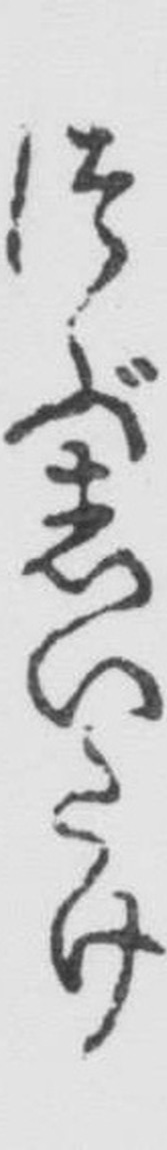つぶしいたけ
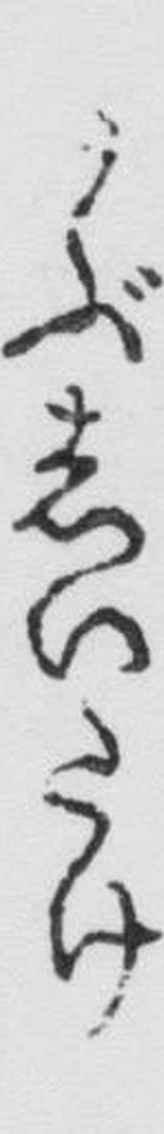ぶしいたけ
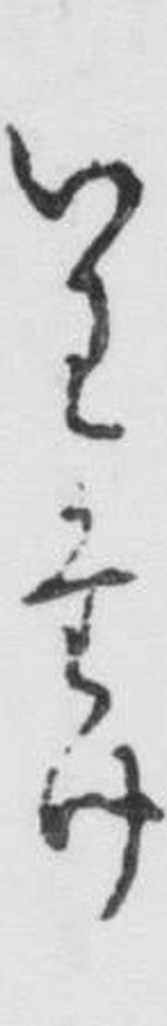いわたけ
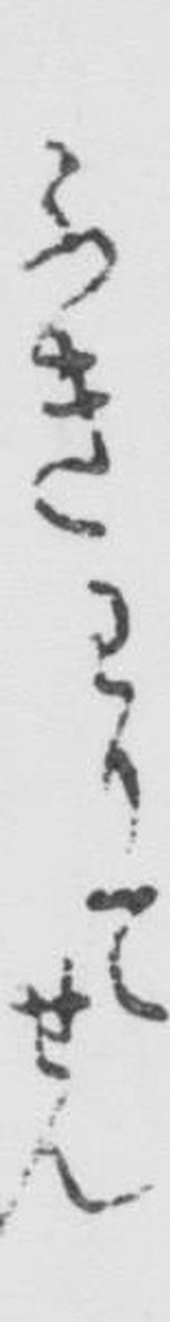ふきわりてせん
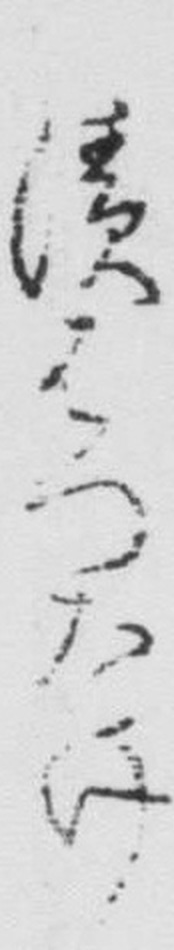漬はつたけ
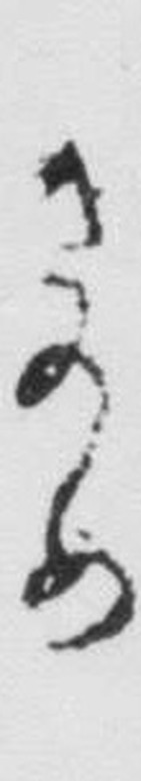きのめ
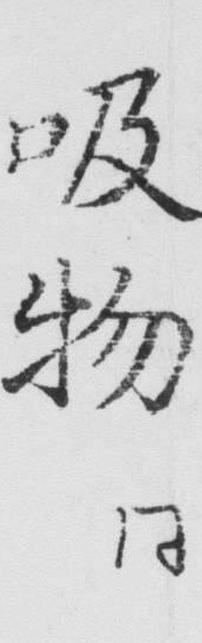吸物同
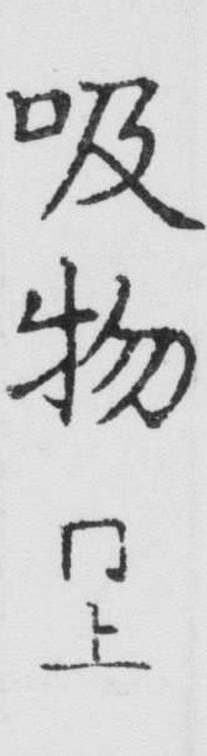吸物同上
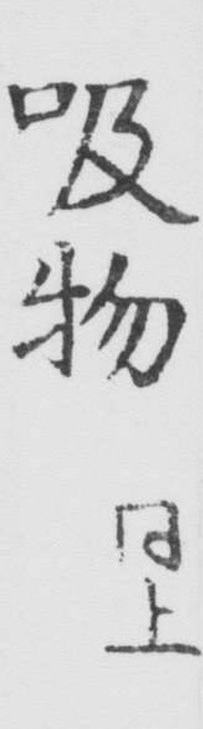吸物同上
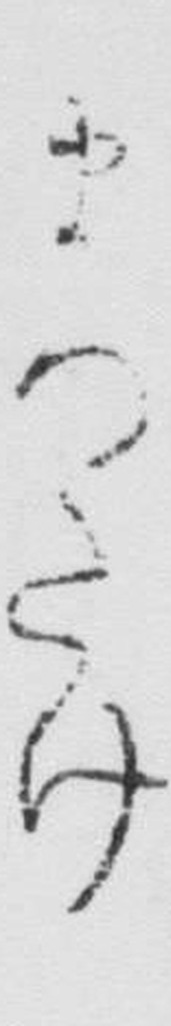まつたけ
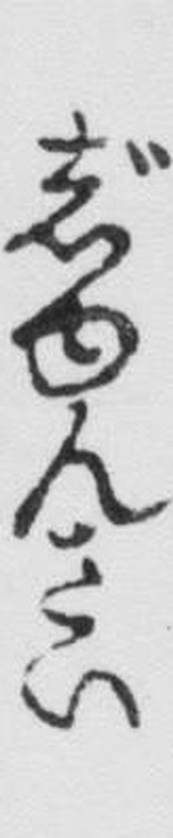じゆんさい
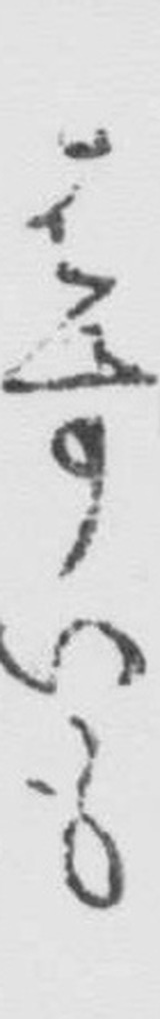はすいも
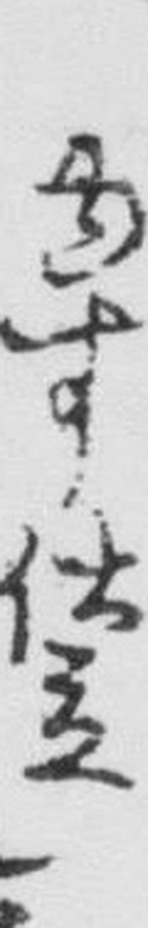ゆす仕立
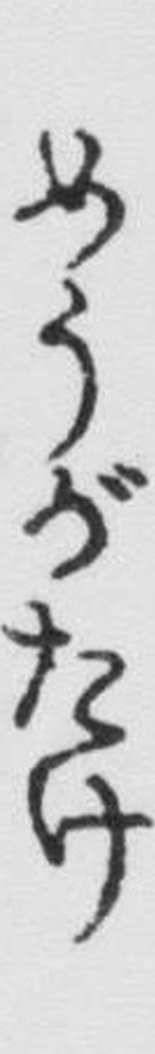めうがたけ
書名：諸家通用/即席料理
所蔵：大阪府立大学学術情報センター 国文学研究資料館
